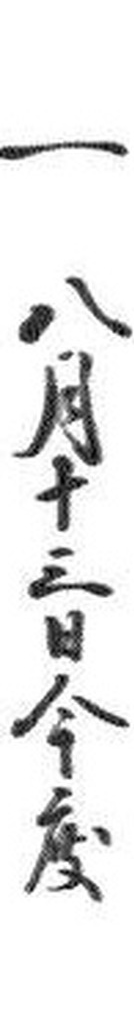一八月十三日今度
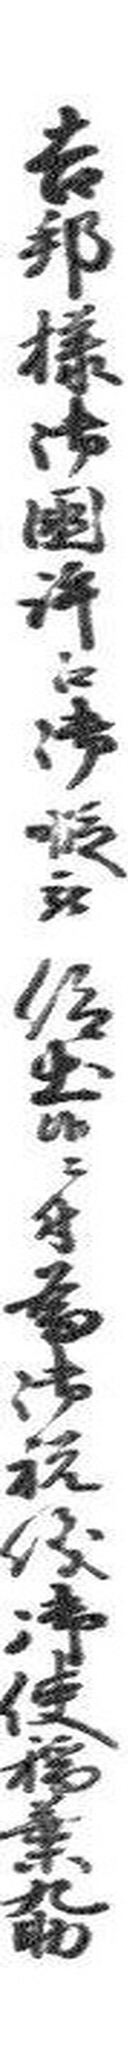吉邦様御国許江御暇被仰出候ニ付為御祝儀御使稲葉九助

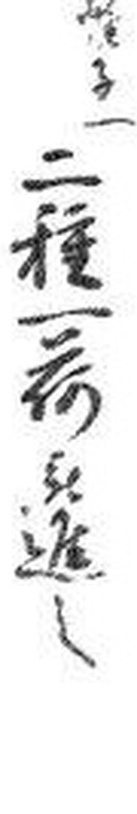服ニ二種一荷被進之
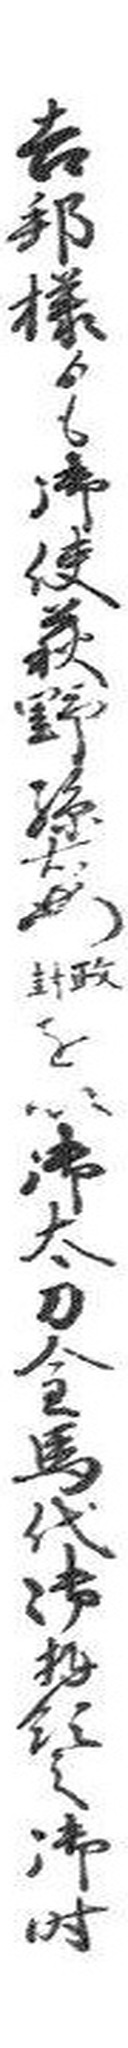吉邦様ゟも御使萩野孫右衛門政封を以御太刀金馬代御拝領之御時
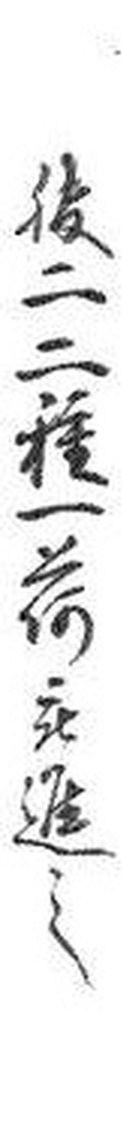服ニ二種一荷被進之
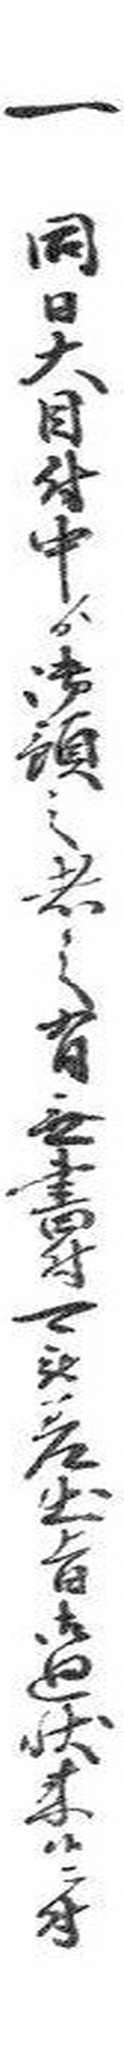一同日大目付中ゟ御預之者之有無書付可被差出旨御廻状来候ニ付
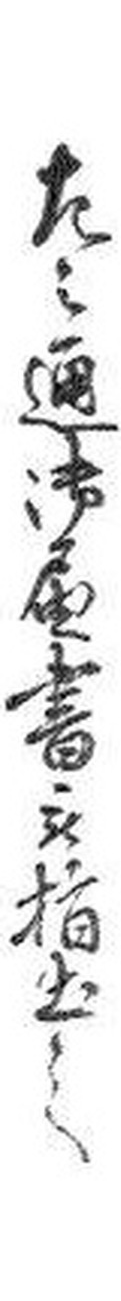左之通御届書被指出之
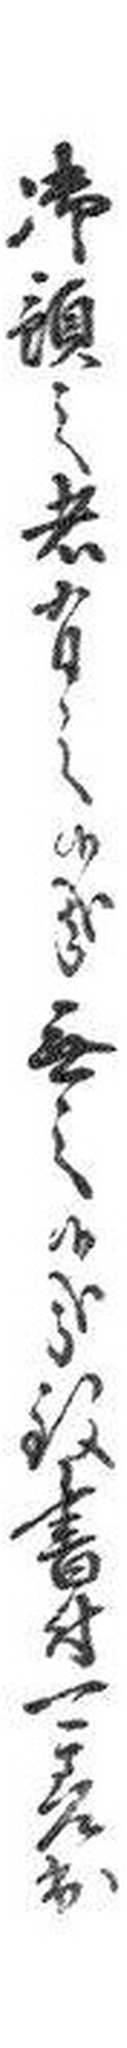御預之者有之候哉無之候哉致書付可差出
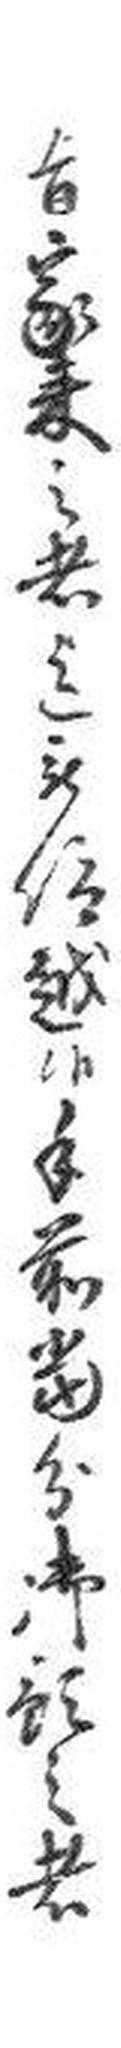旨家来之者迄被仰越候手前当分御預之者
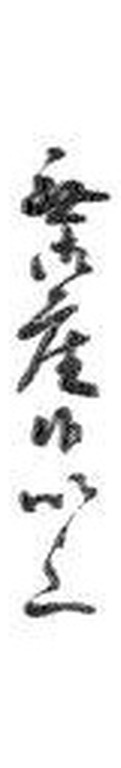無御座候以上
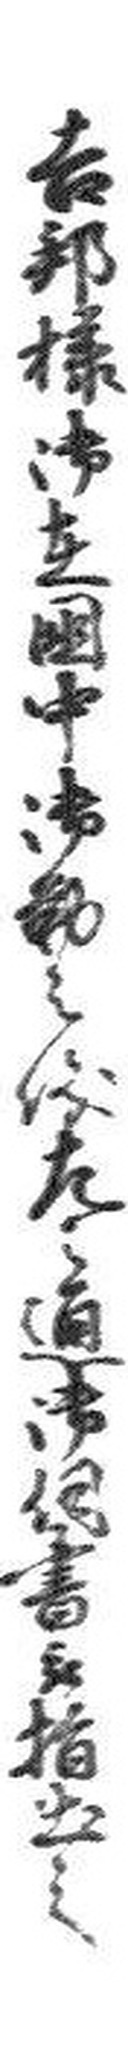吉邦様御在国中御勤之儀左之通御伺書被指出之
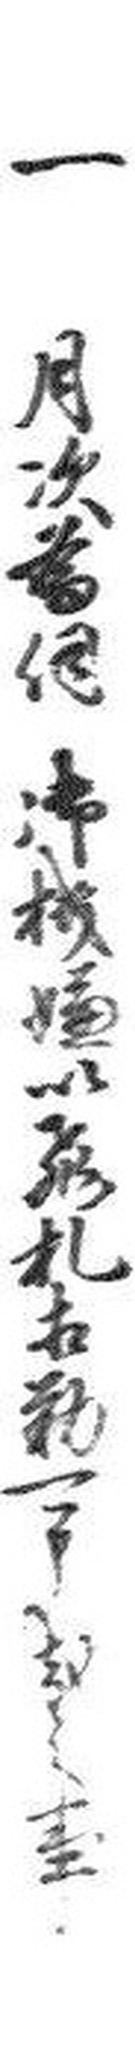一月次為伺御機嫌以飛札相勤可申哉之事
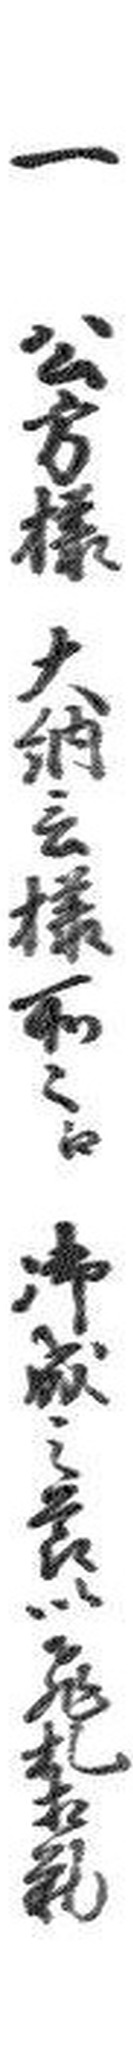一公方様大納言様所々江御成之節以飛札相勤
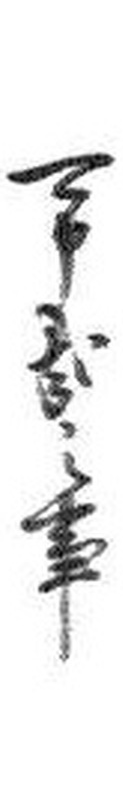可申哉之事
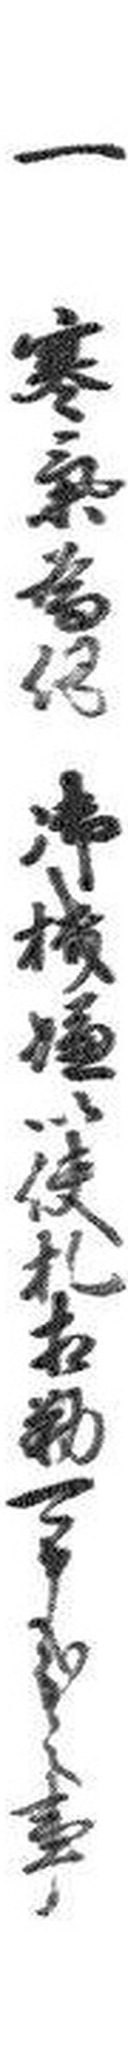一寒気為伺御機嫌以使札相勤可申哉之事

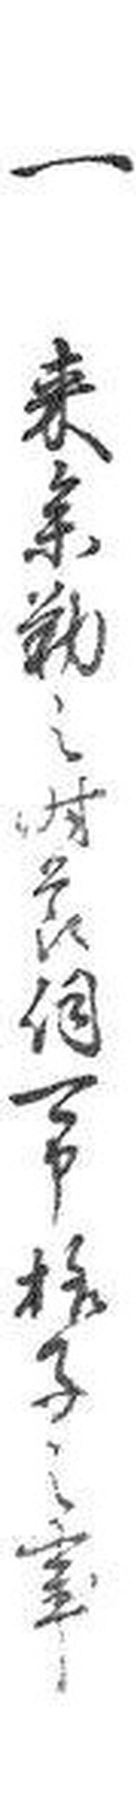一来参勤之時節伺可申様子之事
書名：家譜 二十四 吉品公 従宝永三年到同五年
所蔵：福井県文書館 Fukui Prefectural Archives
